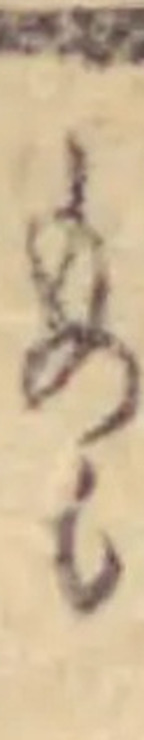ものも
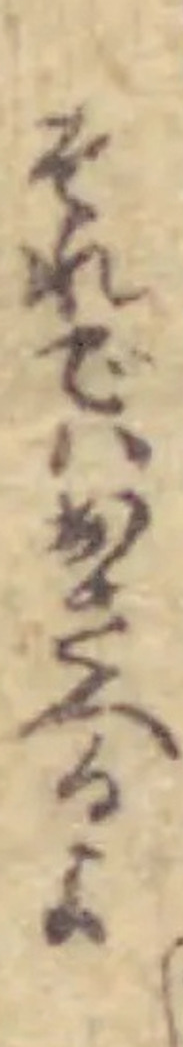それではおさへるよ
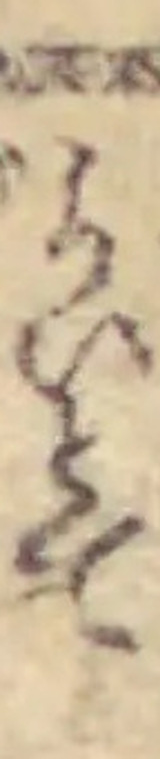よいとて
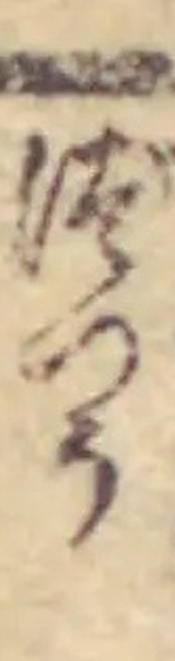づつう
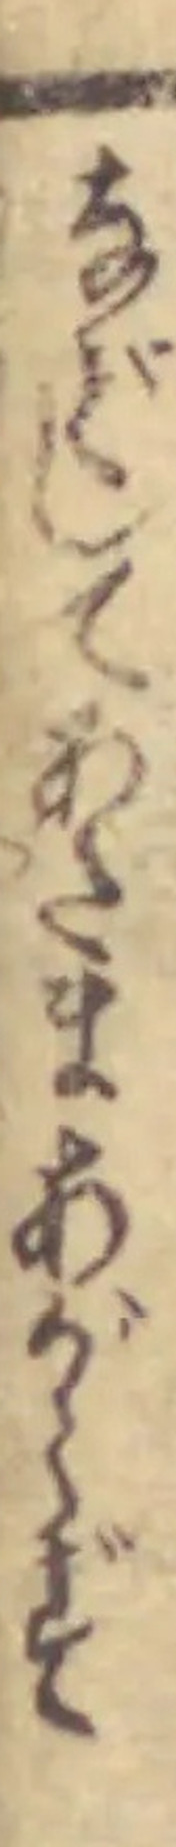などしてあたまあがらず
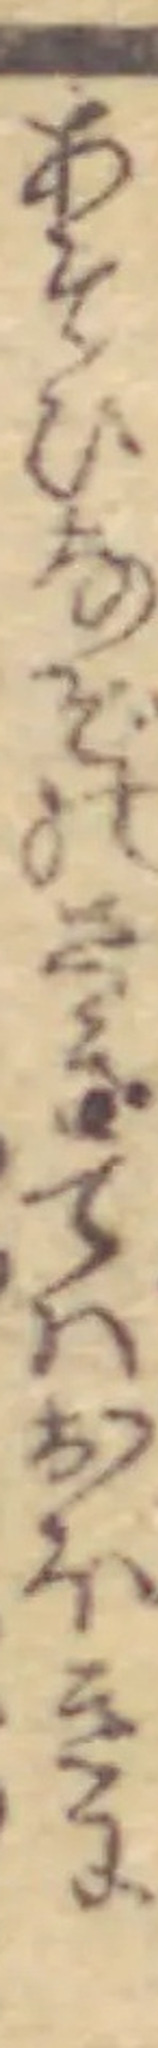あそひなぞのさきてはおほきに
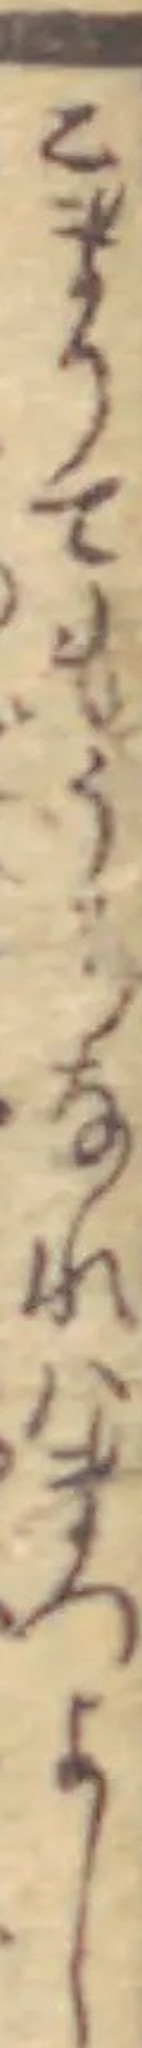こまりてもうちなれはまつよし
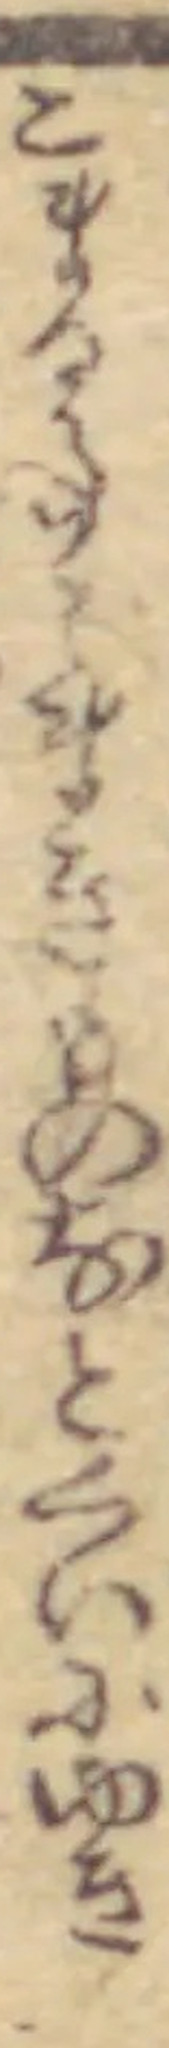こまる事はまきものなとくいにゆき
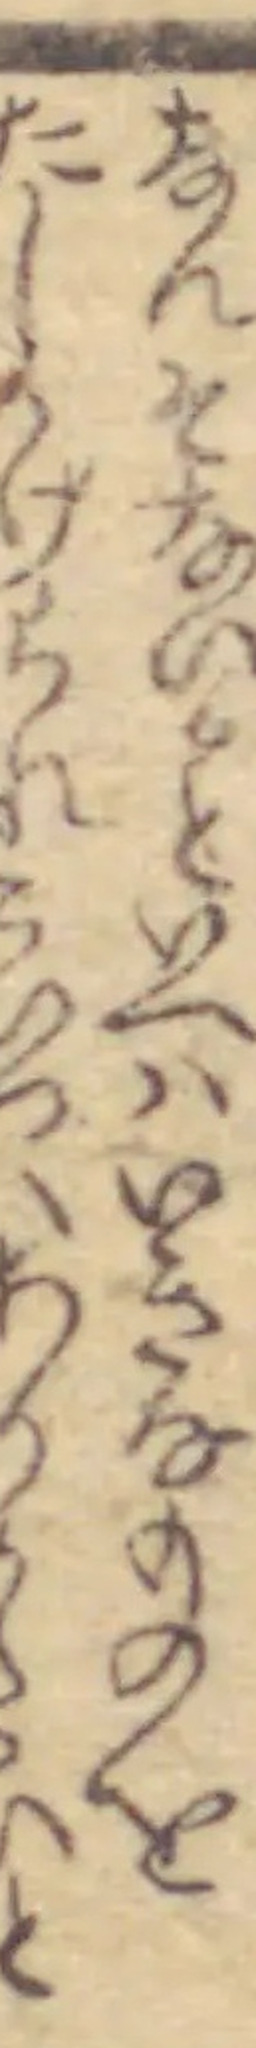たしかけられこいつはありかたいと
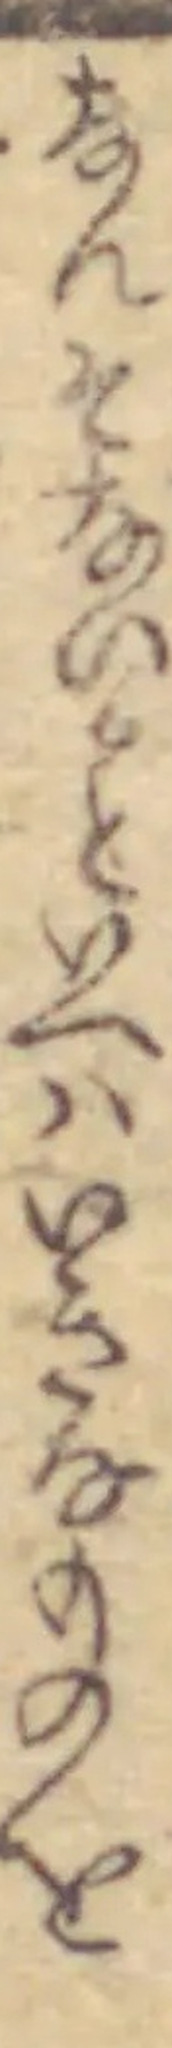なんそないかといへはいきなものを
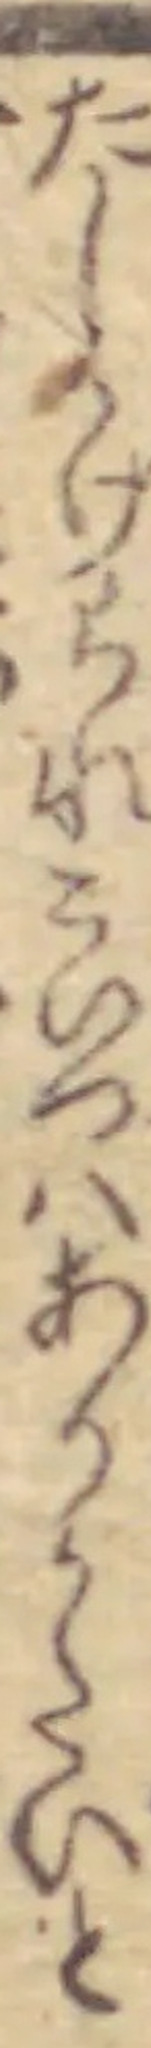たしかけられこいつはありかたいと
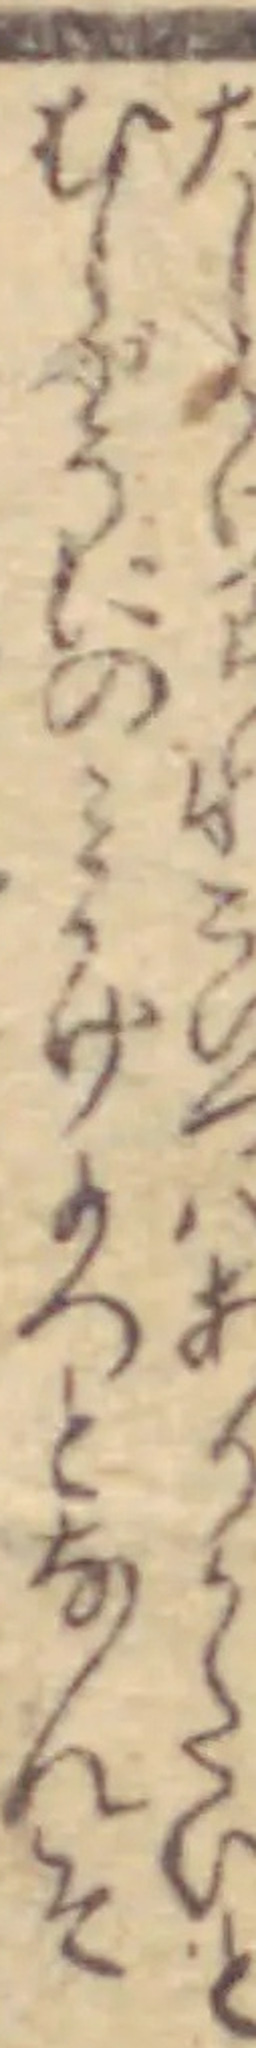むらぶうにのみかけもつとなんそ
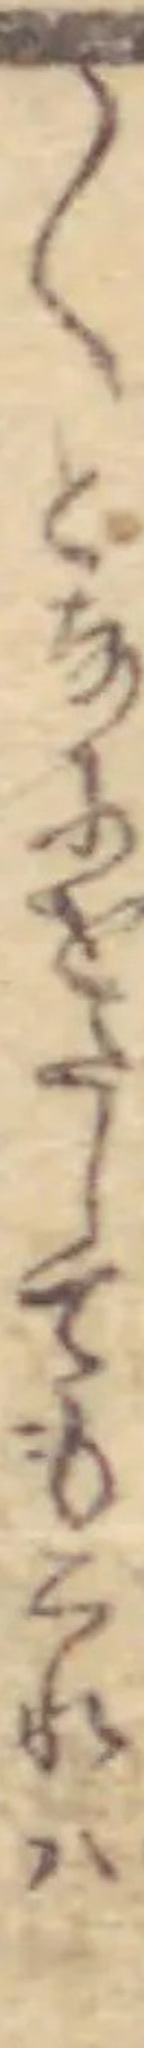〳〵となにをたしてもこれは
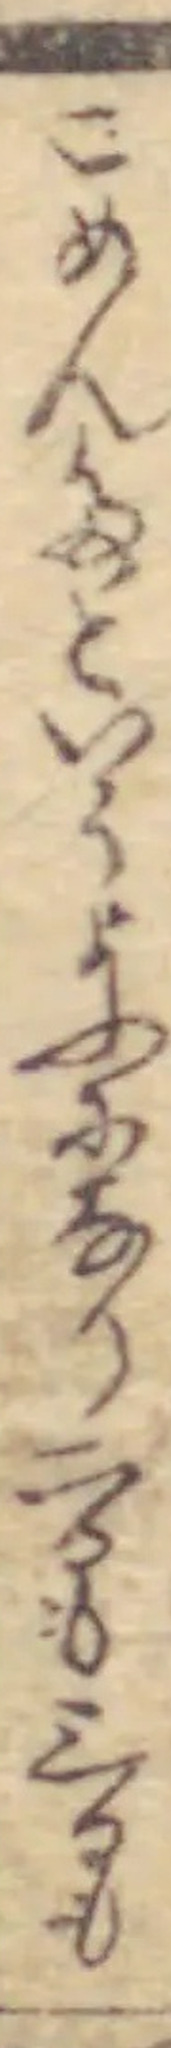こめんたというよふになり二日も三日も
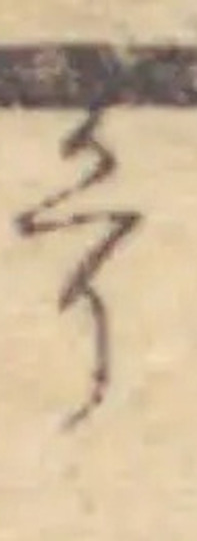かへり
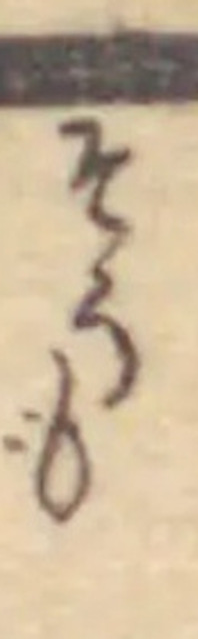そうも
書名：家伝寿命薬 2巻
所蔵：国立国会図書館 National Diet Library, JAPAN
